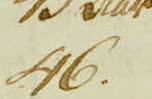46.
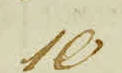10
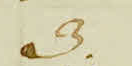3.
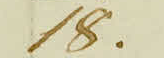18.
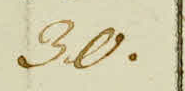30.
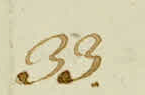33.
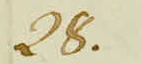28.
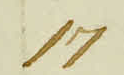17
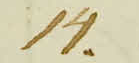14.
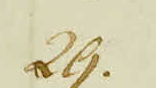29.
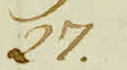27.
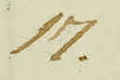17.
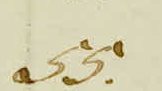55.
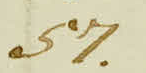57.
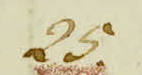25.
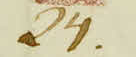24.
